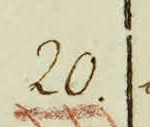20.
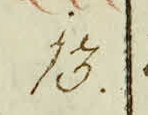13.
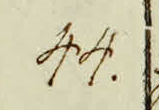44.
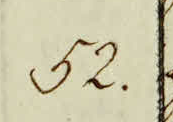52.
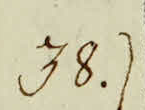38.
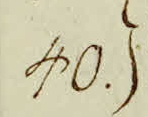40.
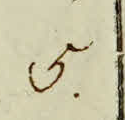5.
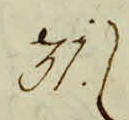31.
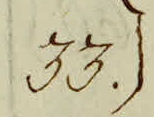33.
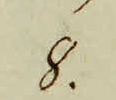8.
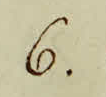6.
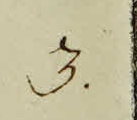3.
